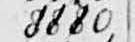8880
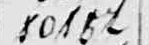10152
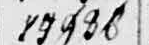17936
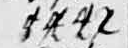5442
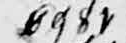6981
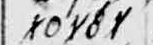10181
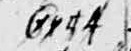6154
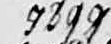5399
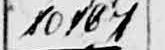10167
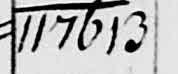117612
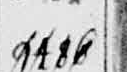9486
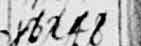13248
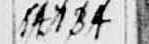14734
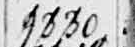9330
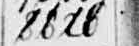8626
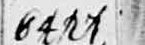6427
